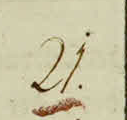21.
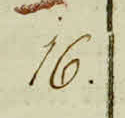16.
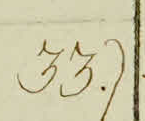33.
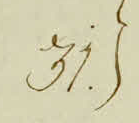31.
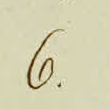6.
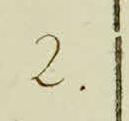2.
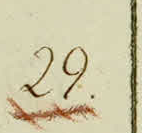29.
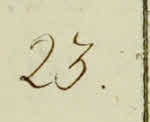23.
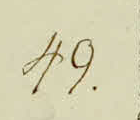49.
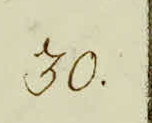30.
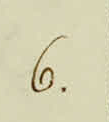6.
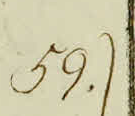59.
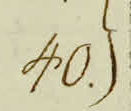40.
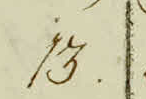13.
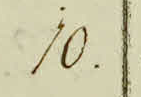10.
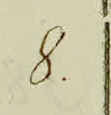8.
